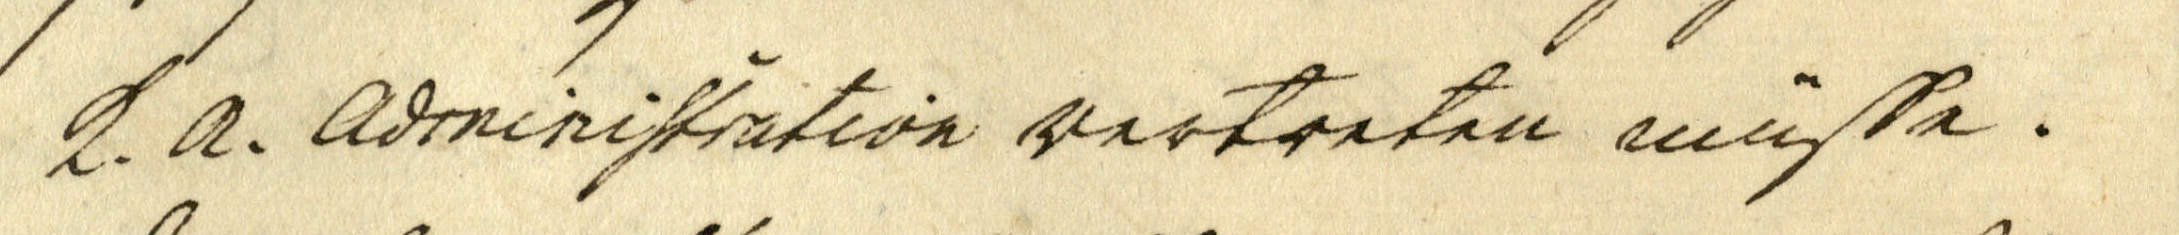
K. A. Administration vertreten müsse.
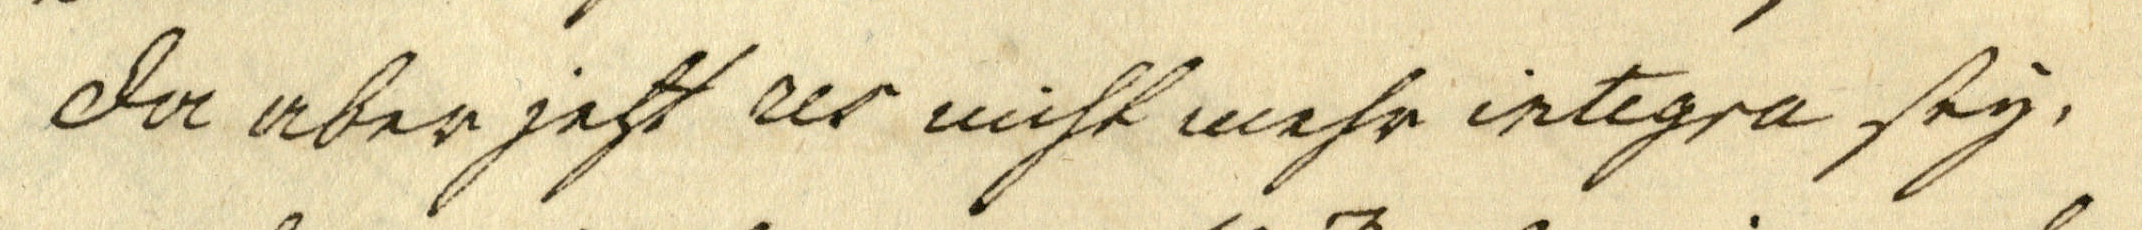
Da aber jetzt res nicht mehr integra seÿ,
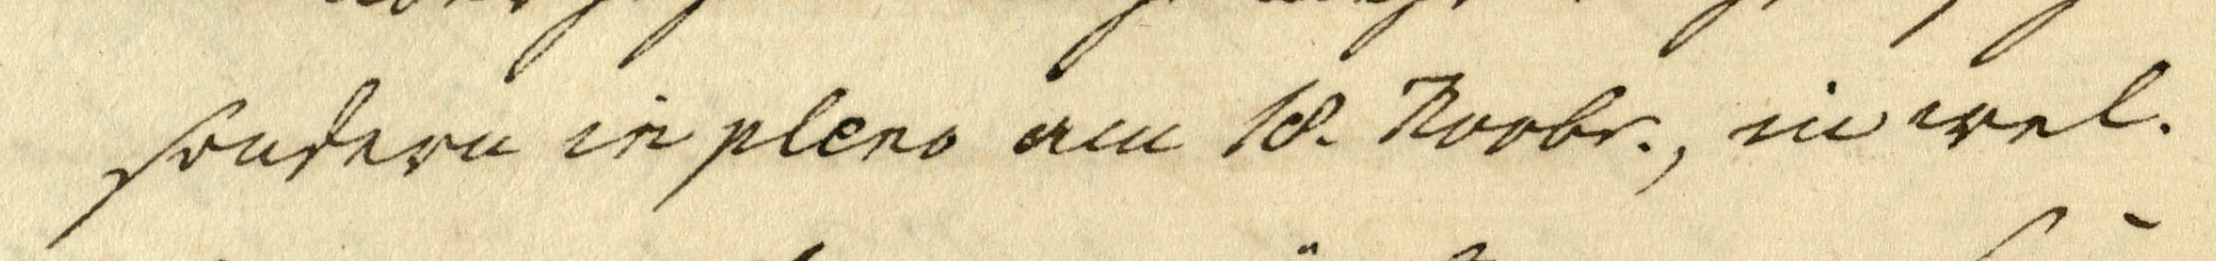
sondern in pleno am 18. Novbr., in wel¬
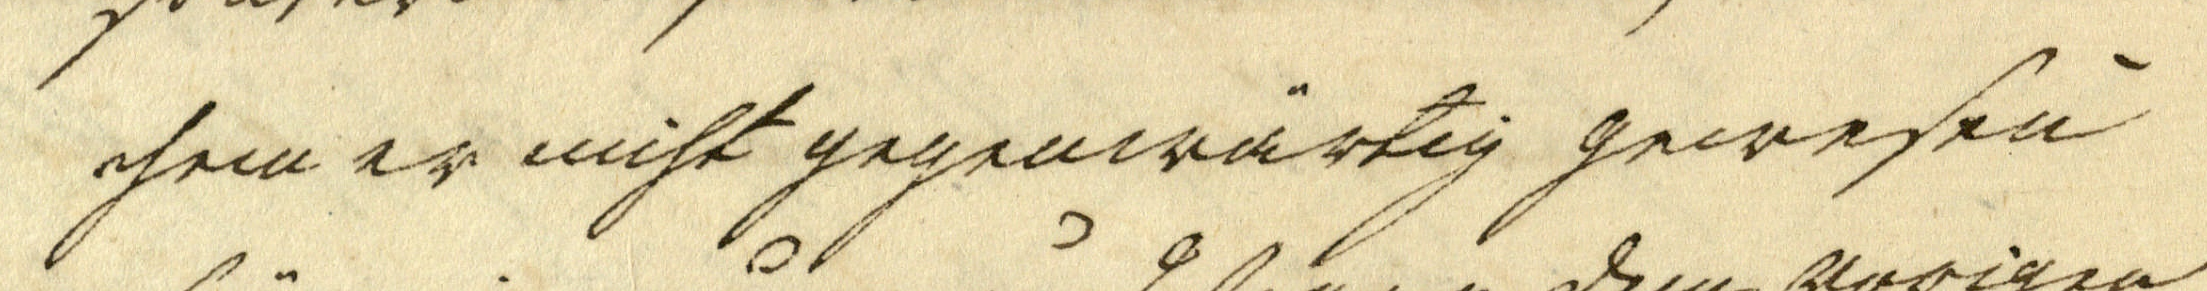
chem er nicht gegenwärtig gewesen
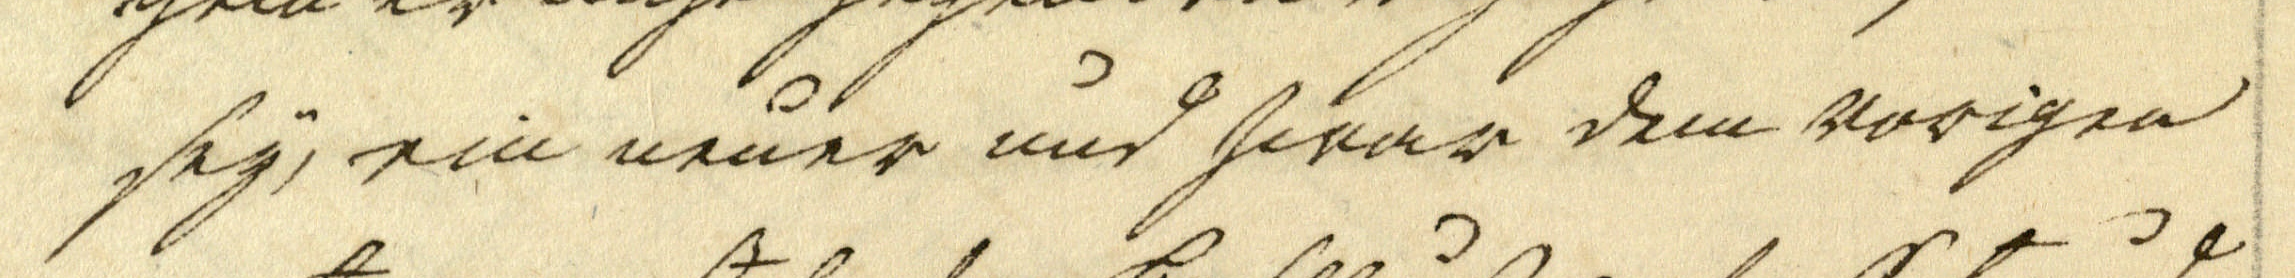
seÿ, ein neuer und zwar dem vorigen
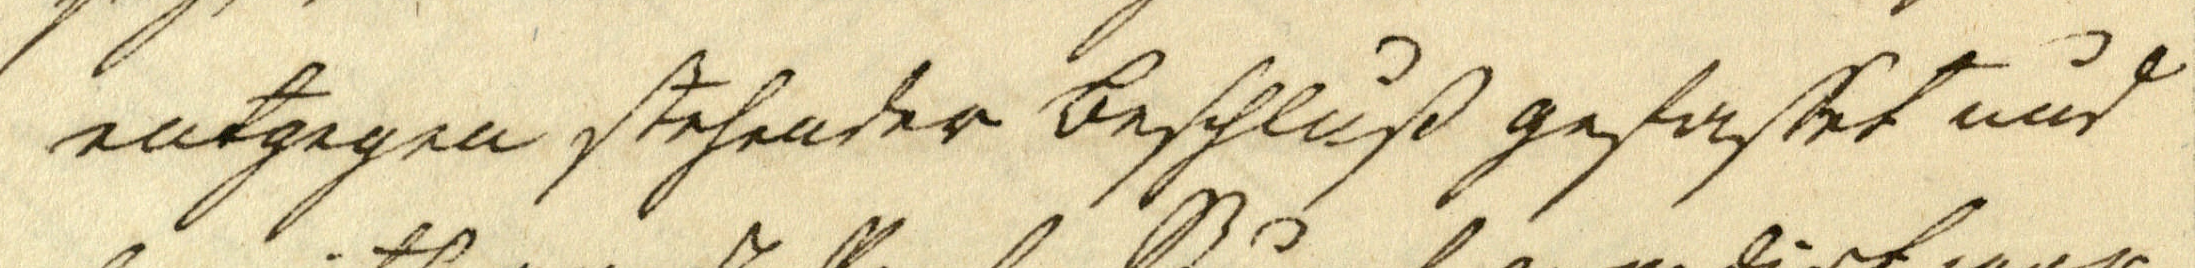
entgegen stehender Beschluß gefasset und
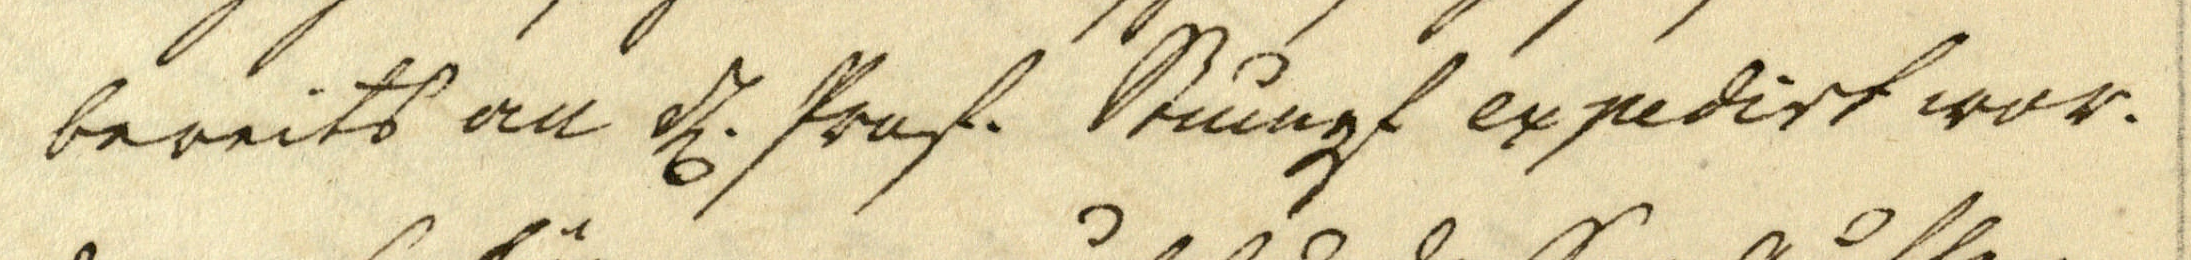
bereits an dh. Prof. Stumpf expedirt wor¬
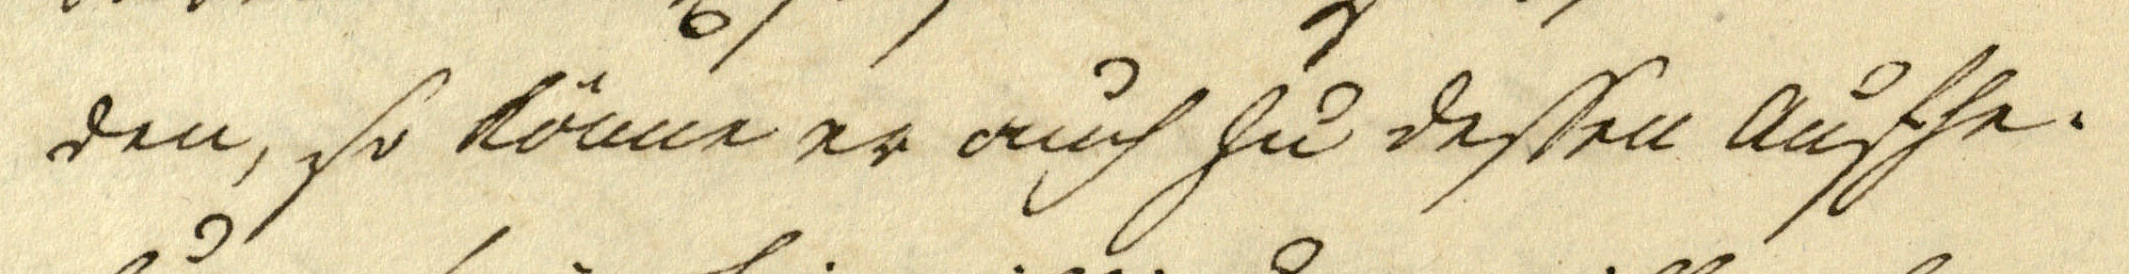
den, so könne er auch zu dessen Aufhe¬
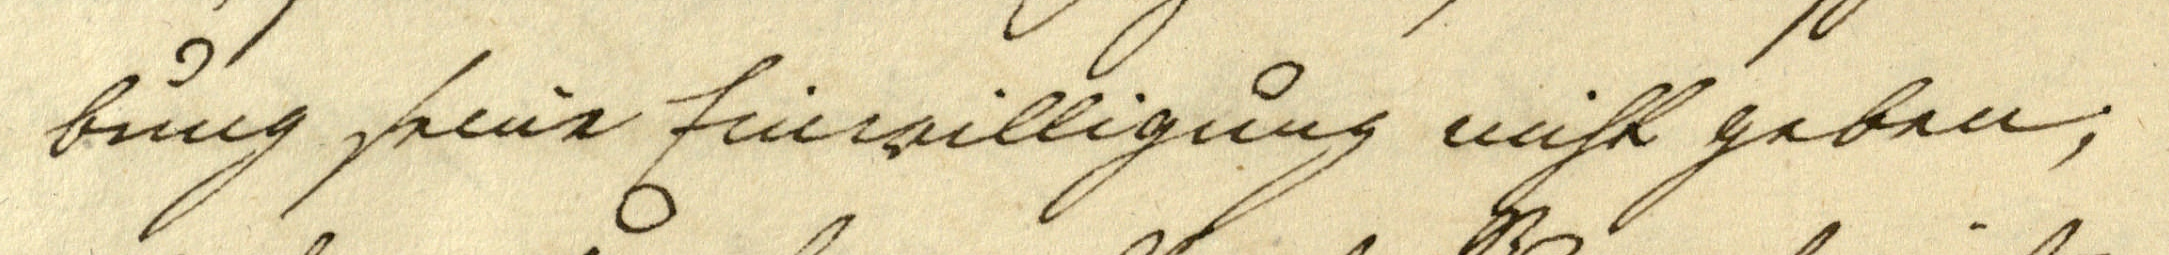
bung seine Einwilligung nicht geben,
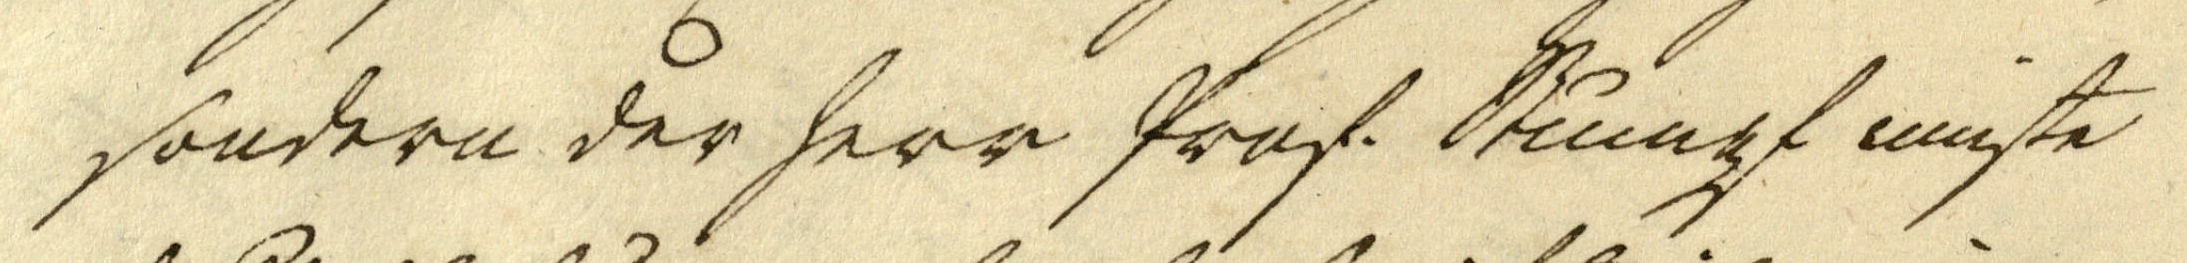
sondern der Herr Prof. Stumpf müste
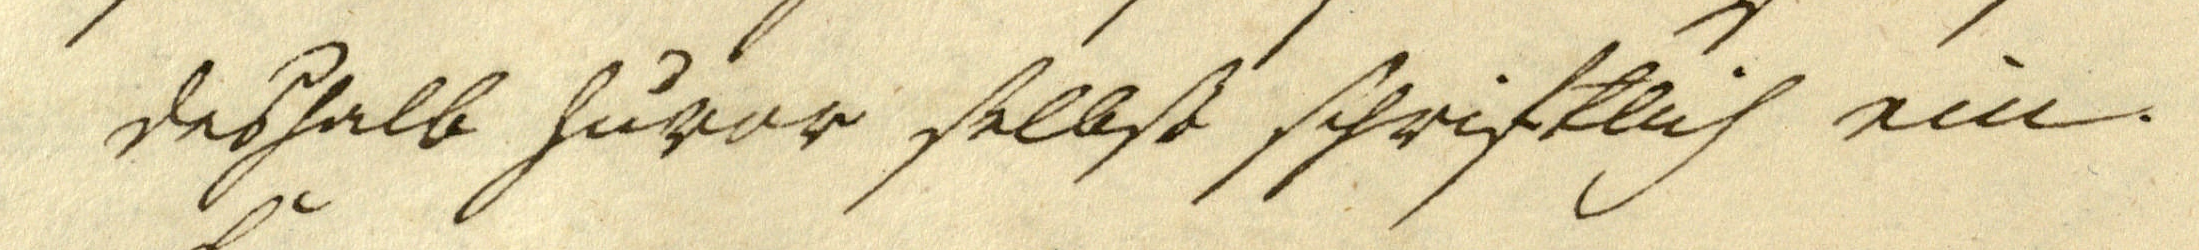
deshalb zuvor selbst schriftlich ein¬
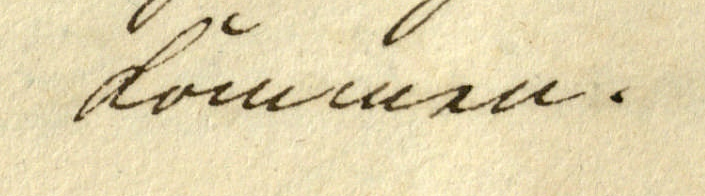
kommen.
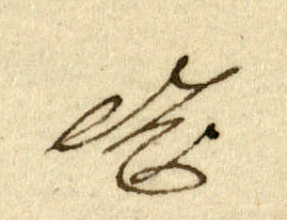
dh.
